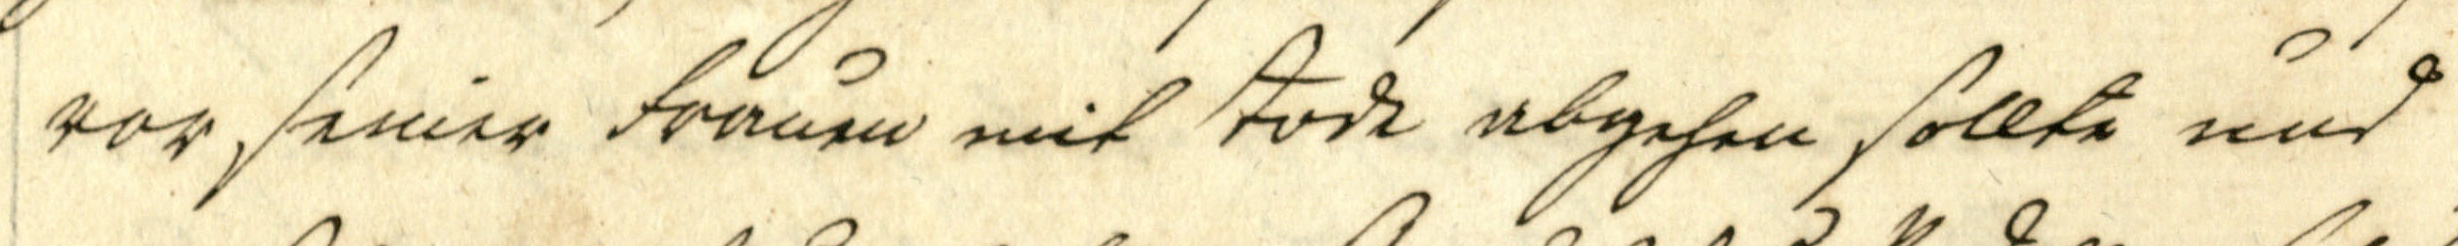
vor seiner Frauen mit Tode abgehen sollte und
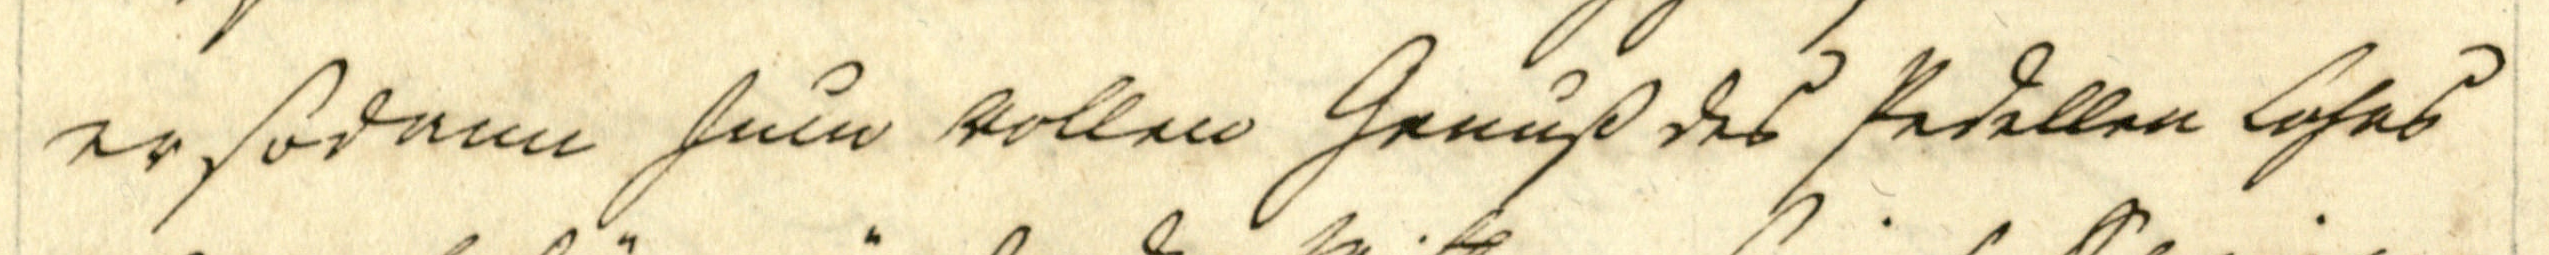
er sodann zum vollen Genuß des Pedellen Lohns
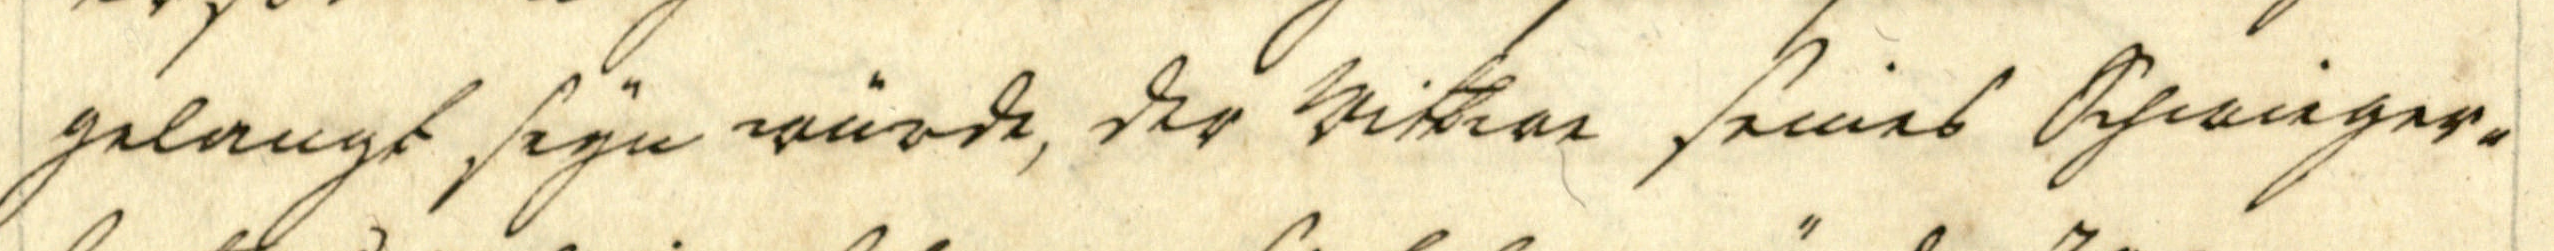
gelangt seÿn würde, der Wittwe seines Schwieger¬
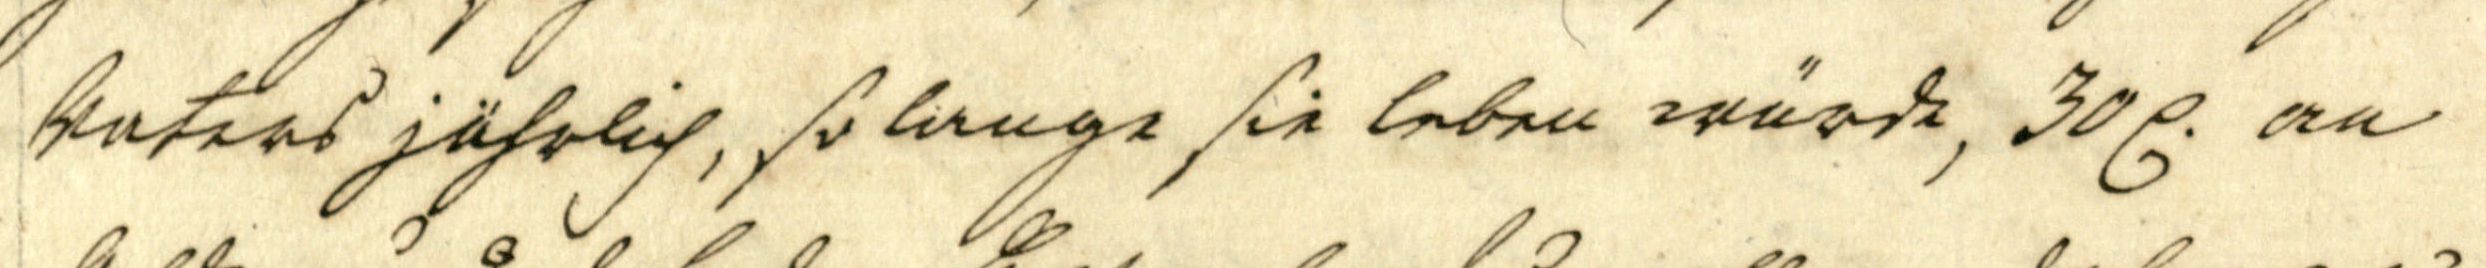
Vaters jährlich, so lange sie leben würde, 30 l. an
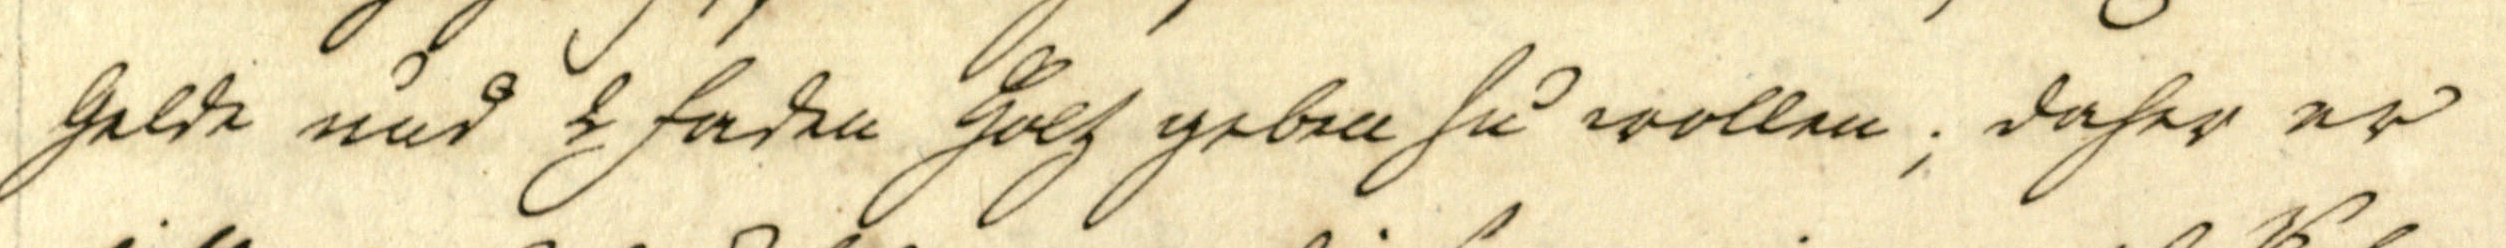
Gelde und 2 Faden Holz geben zu wollen, daher er
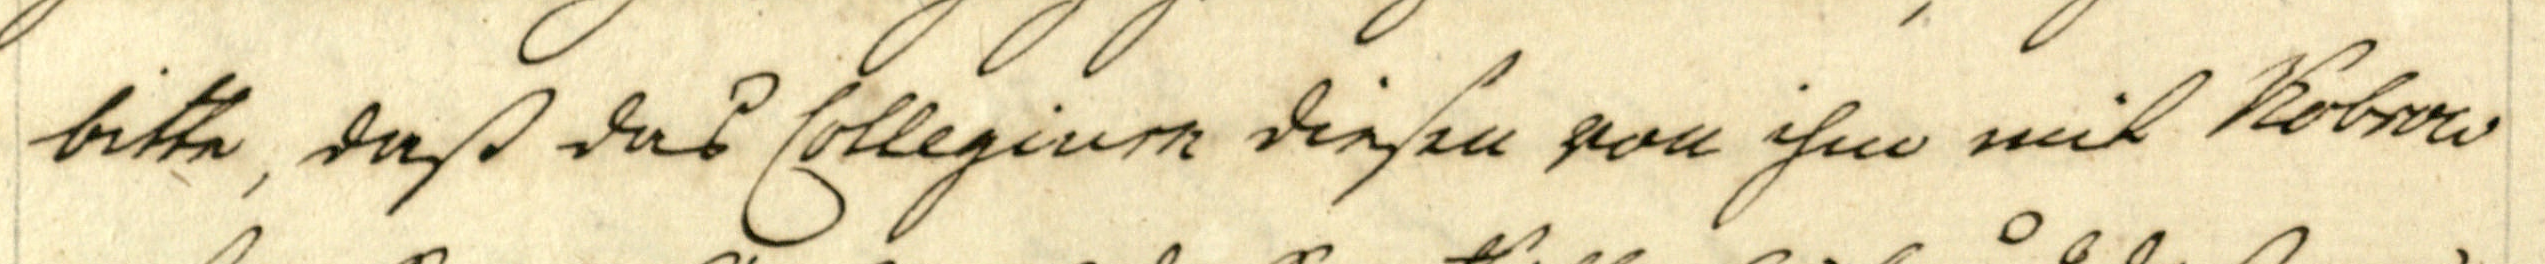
bitte, daß das Collegium diesen von ihm mit Kobrow
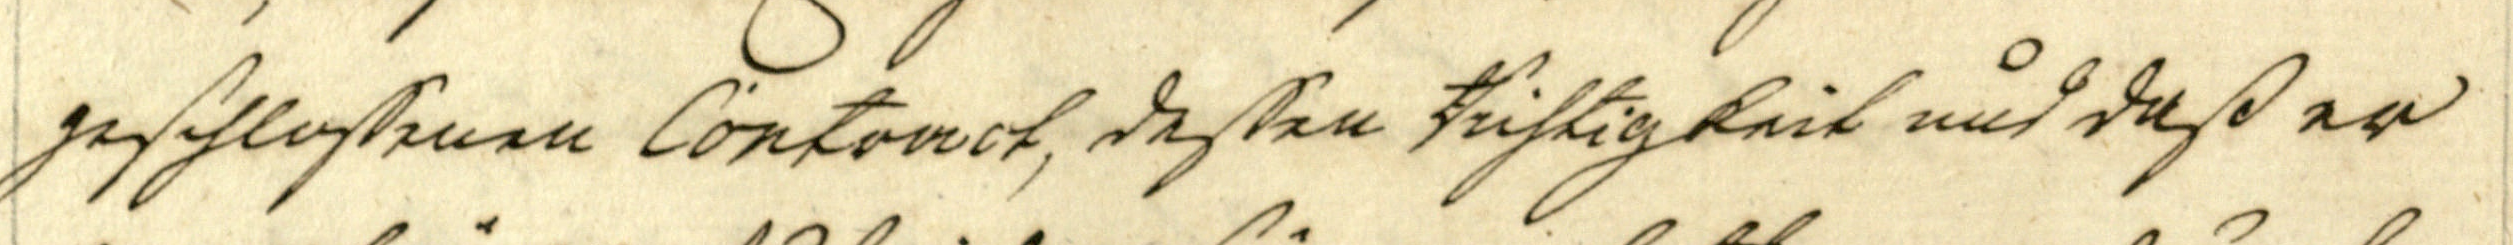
geschlossenen Contract, dessen Richtigkeit und daß er
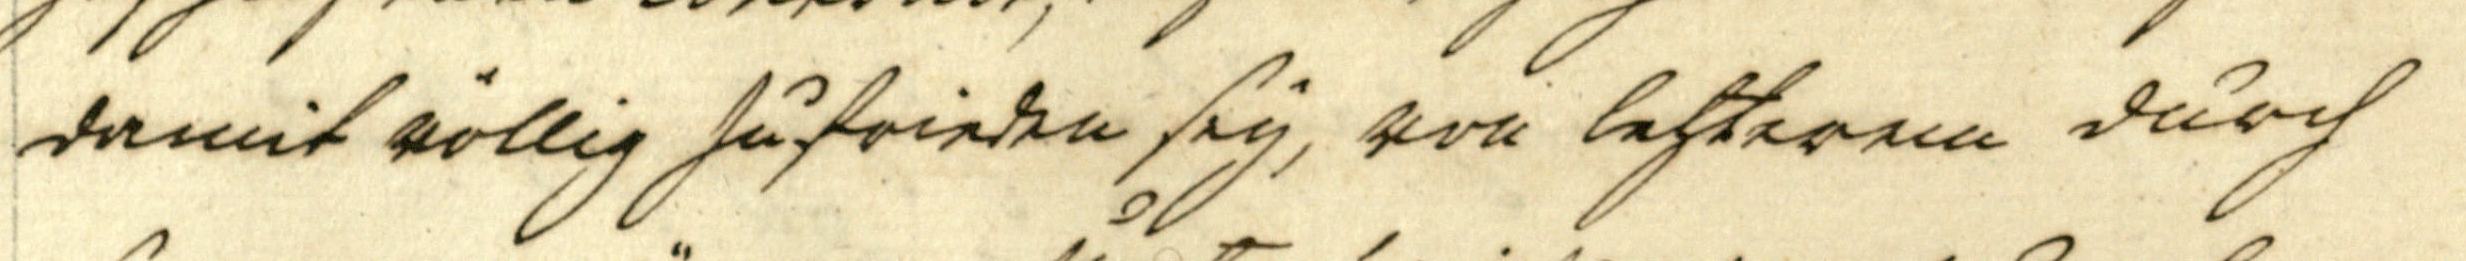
damit völlig zufrieden seÿ, von letzterem durch
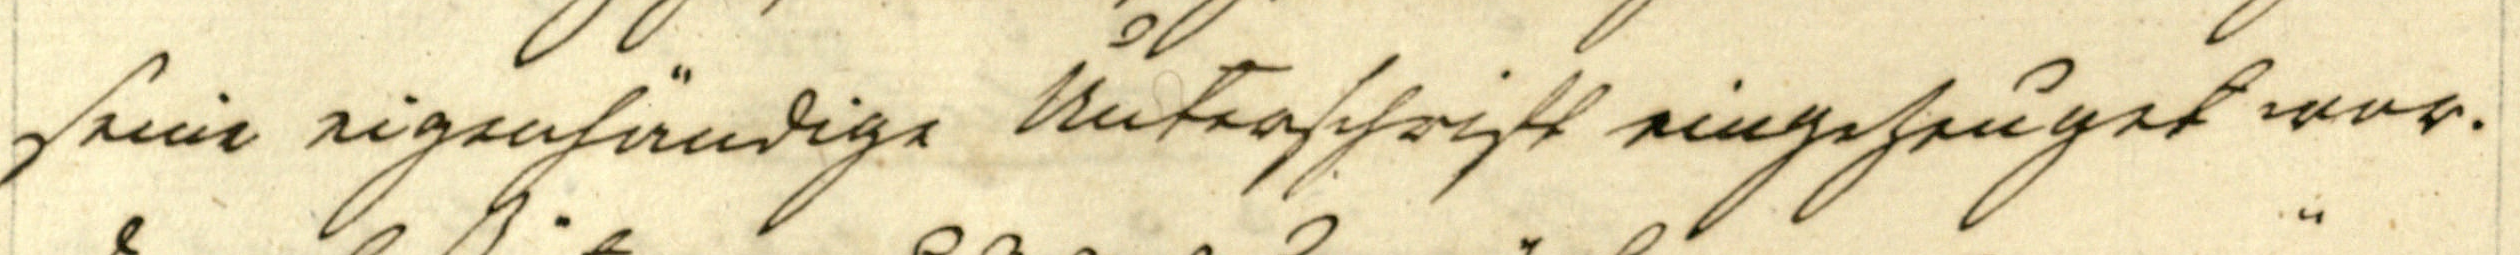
seine eigenhändige Unterschrift eingezeuget wor¬
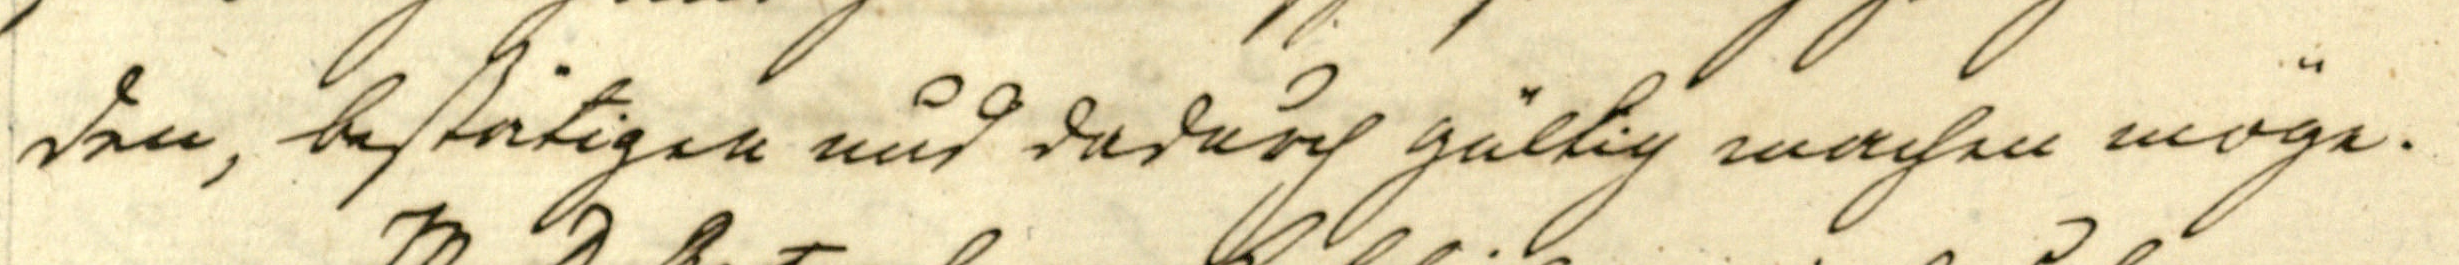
den, bestätigen und dadurch gültig machen möge.
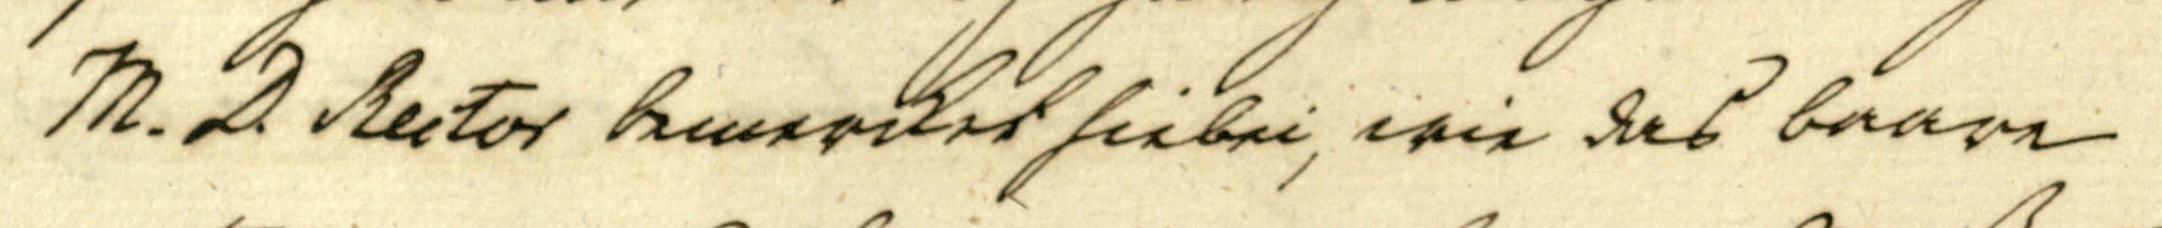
M. D. Rector bemercket heute, wie das baare
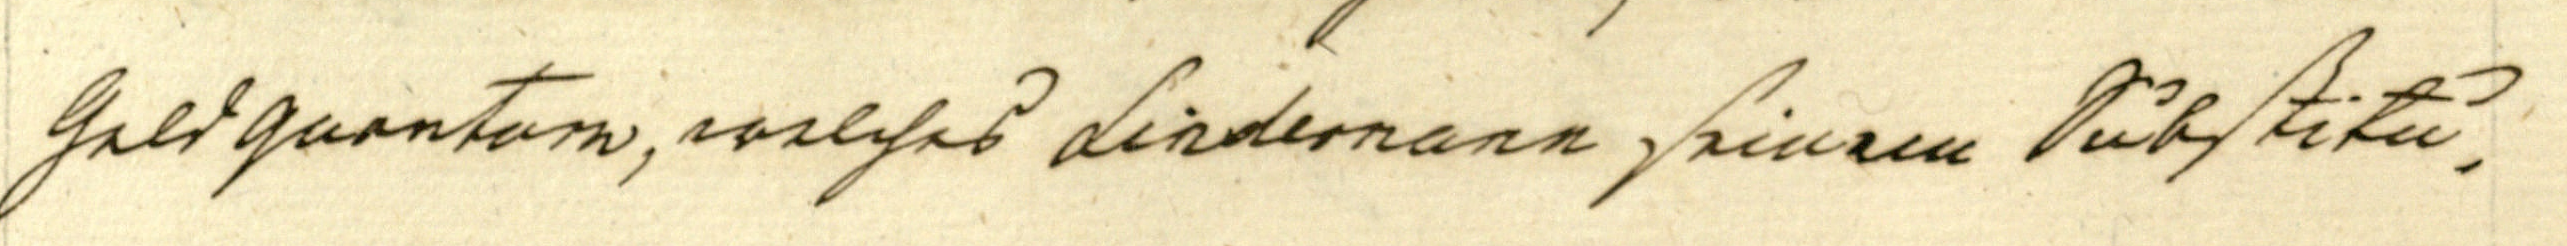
Geld Quantum, welches Lindemann seinem Substitu¬
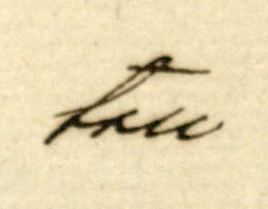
ten
